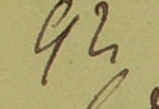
92
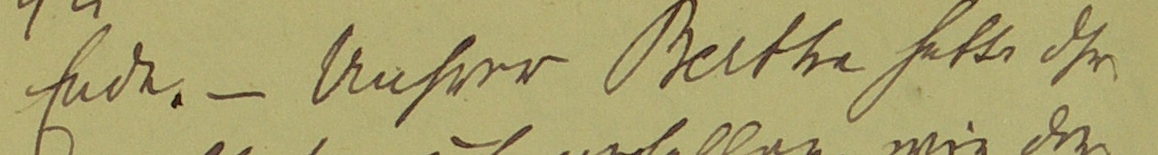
Ende.- Unserer Bertha hatte dieser
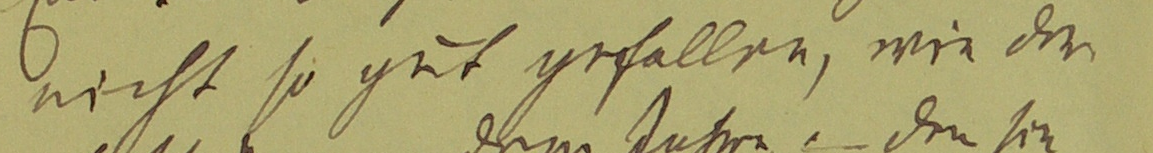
nicht so gut gefallen, wie der
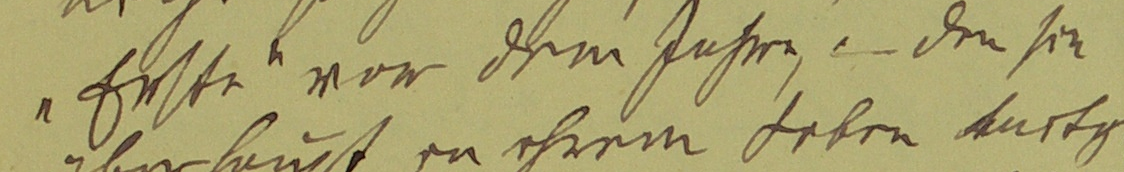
„ Erste“ vor drei Jahren,den sie
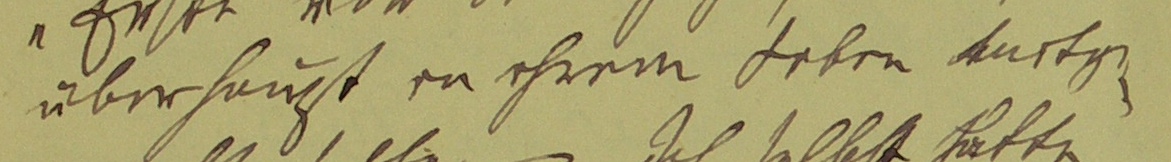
überhaupt in ihrem Leben? .?.ge¬
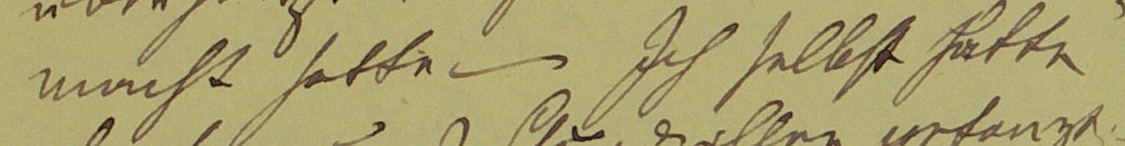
macht. hatte,- Ich selbst hatte
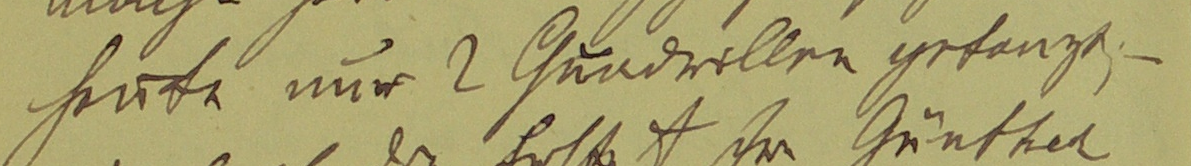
heute nur 2 Quadrillen getanzt,-
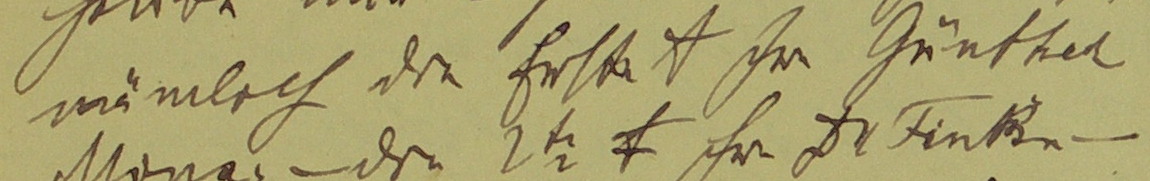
nämlich der erste mit Frau Günthel
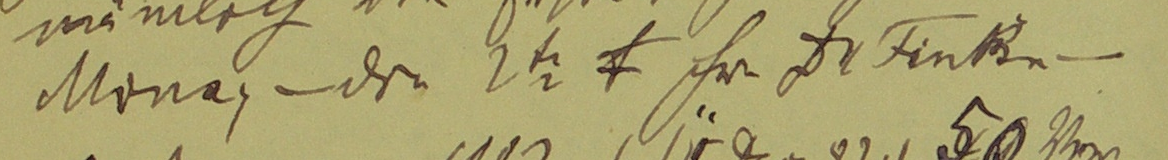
Mona und der 2-te mit Frau Dr. Fink.
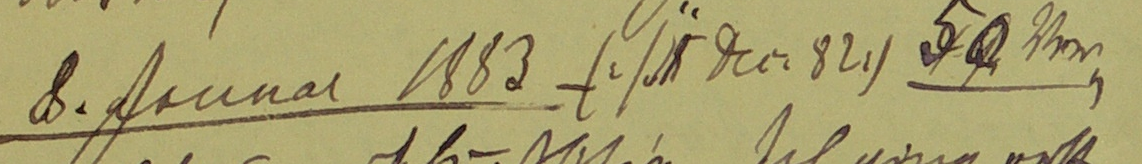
8. Januar 1883.--?... 50.te Ver¬
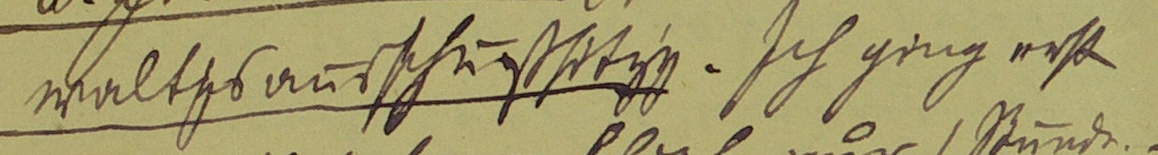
waltungsausschußsitzung … Ich ging erst
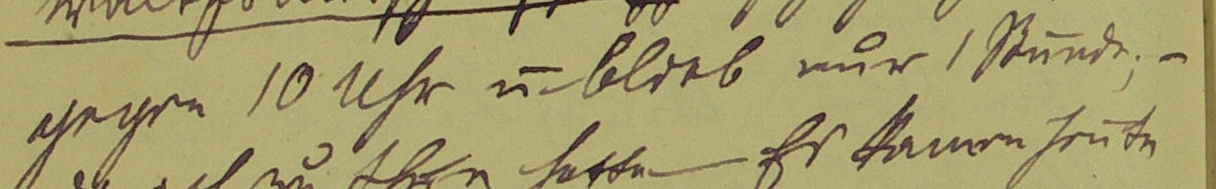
gegen 10 Uhr und blieb nur 1 Stunde,-
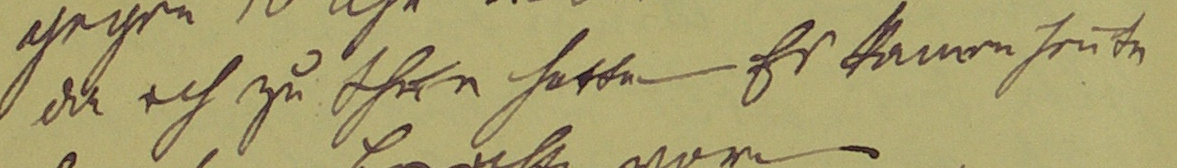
da ich zu thun hatte.- Es kamen heute
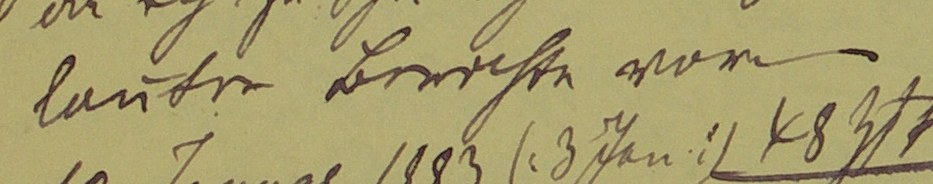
lauter Berichte vor.-
